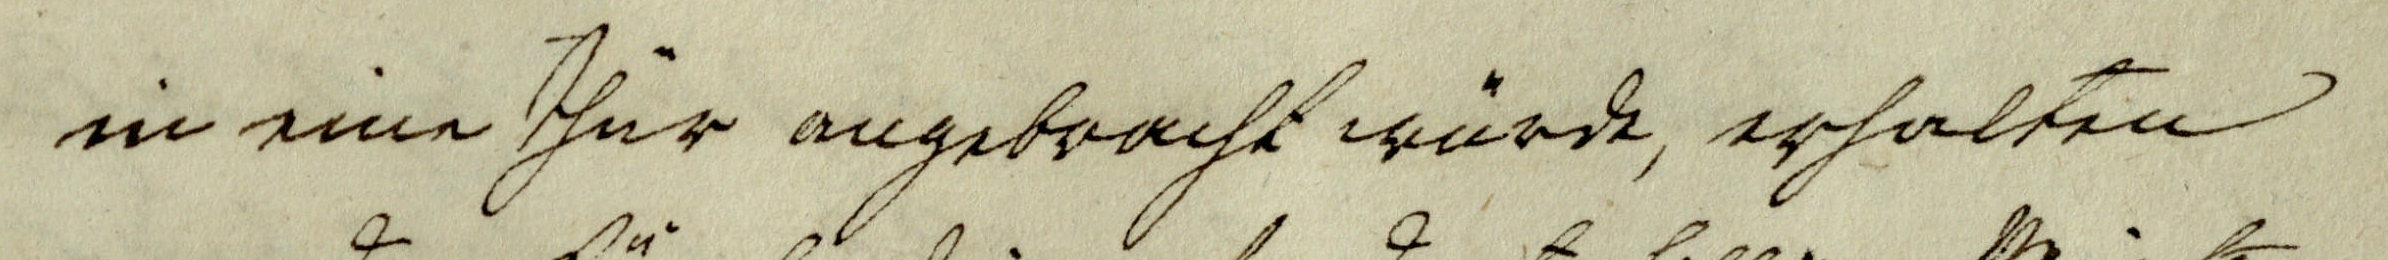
in eine Thür angebracht würde, erhalten
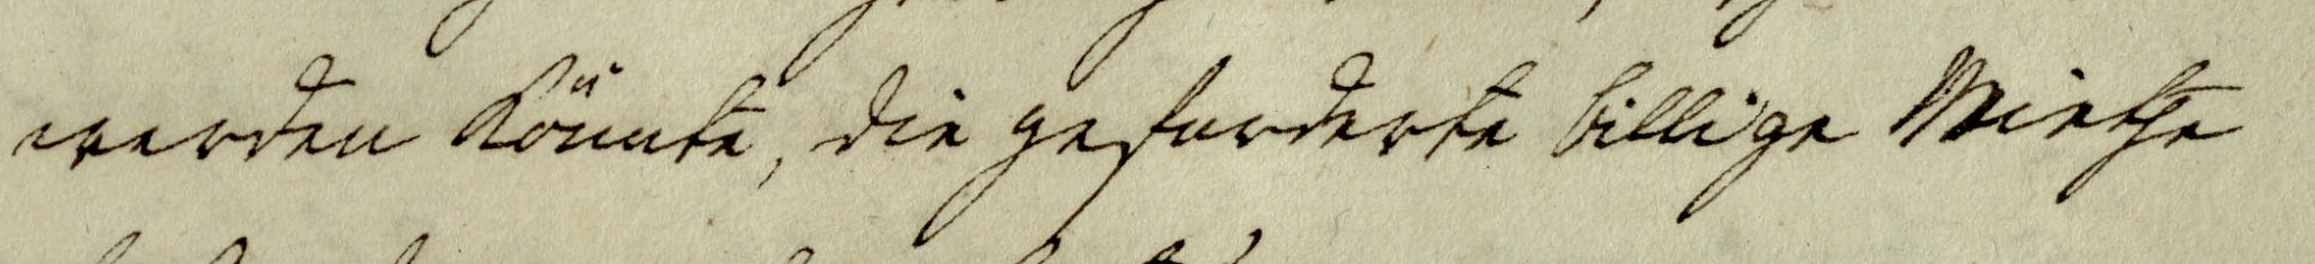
werden könnte, die geforderte billige Miethe
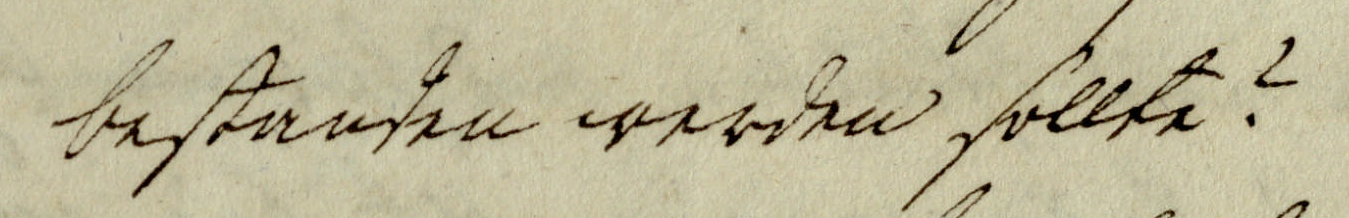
bestanden werden sollte?
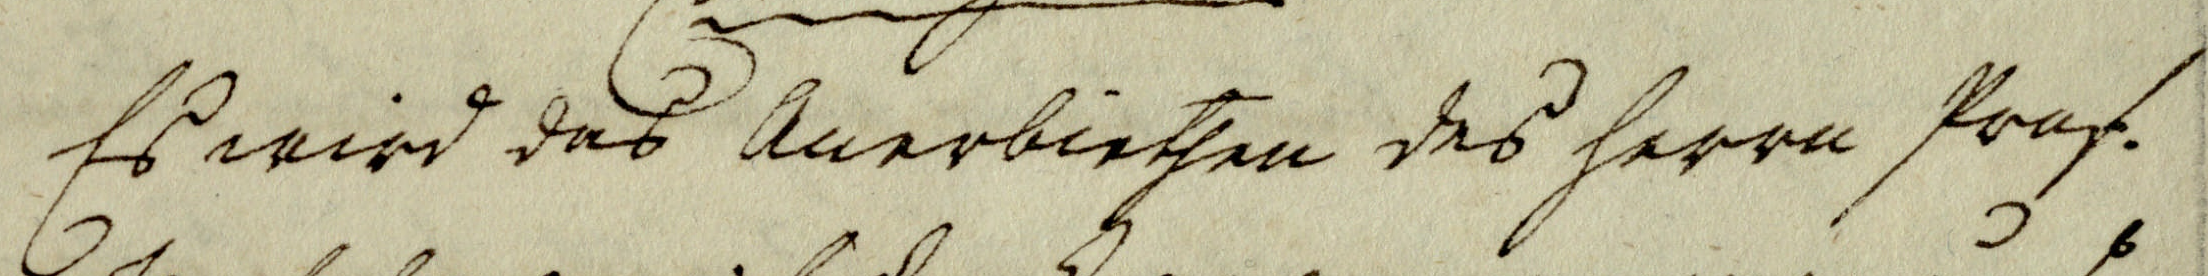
Es wird das Anerbiethen des Herrn Prof.
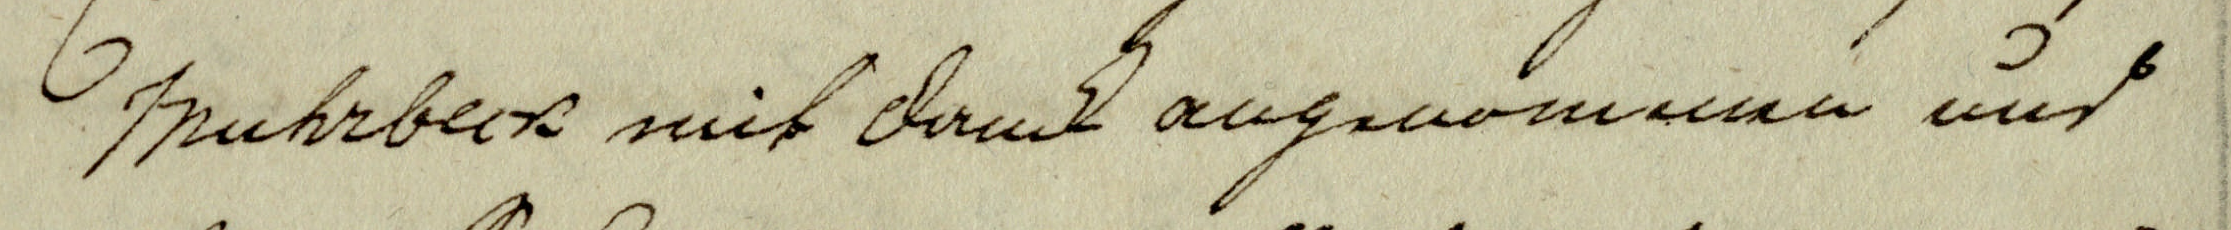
Muhrbeck mit Danck angenommen und
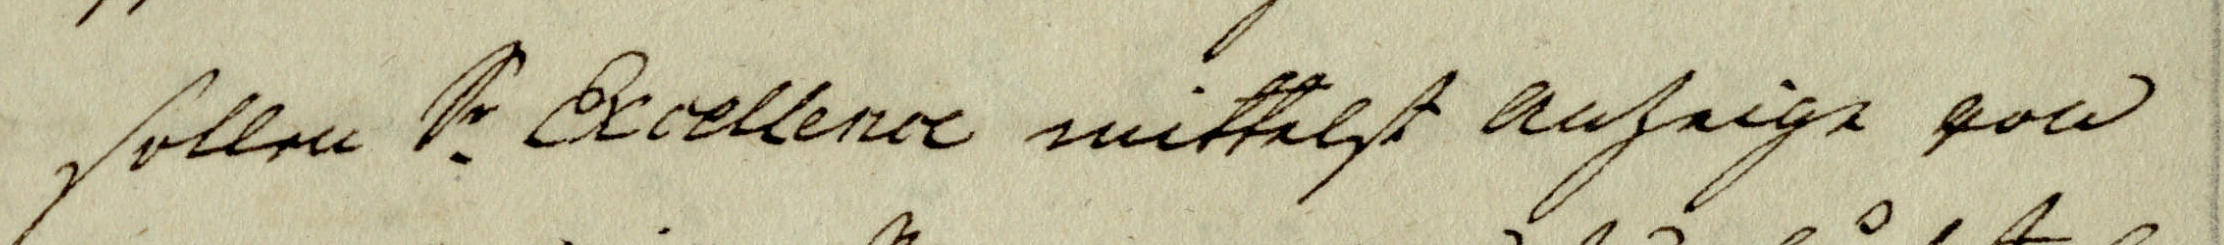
sollen Sr Excellence mittelst Anzeige von
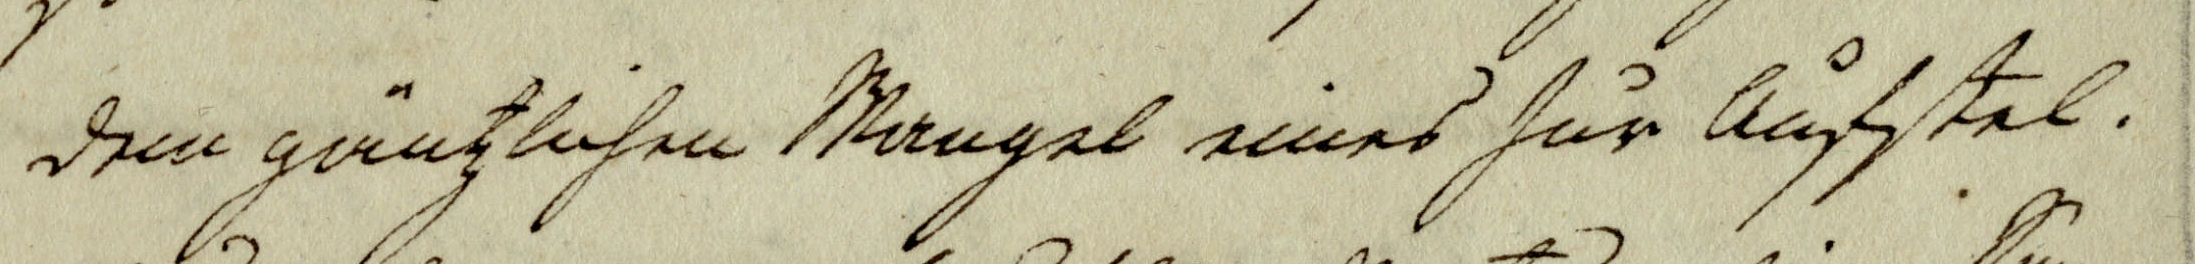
dem gäntzlichen Mangel eines zur Aufstel¬
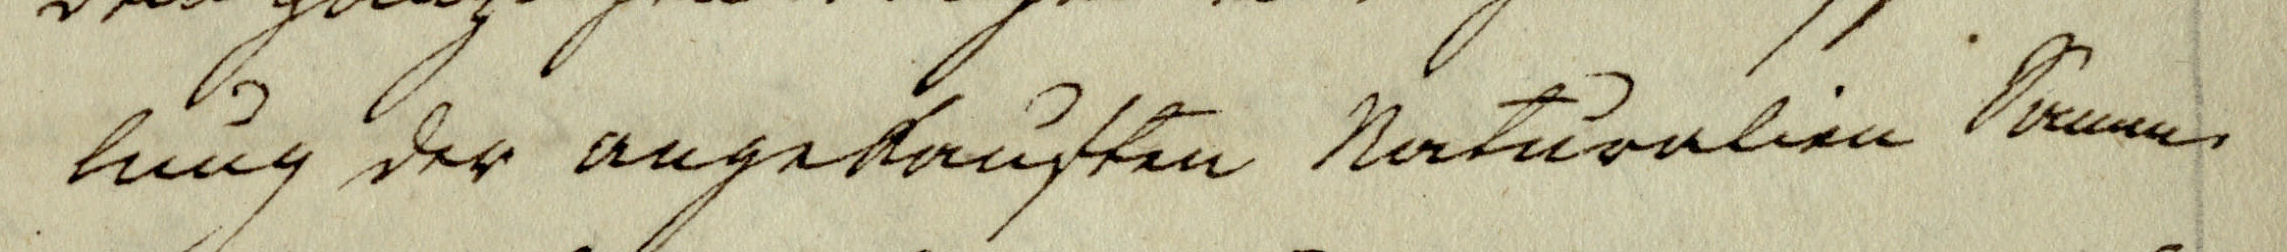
lung der angekauften Naturalien Samm¬
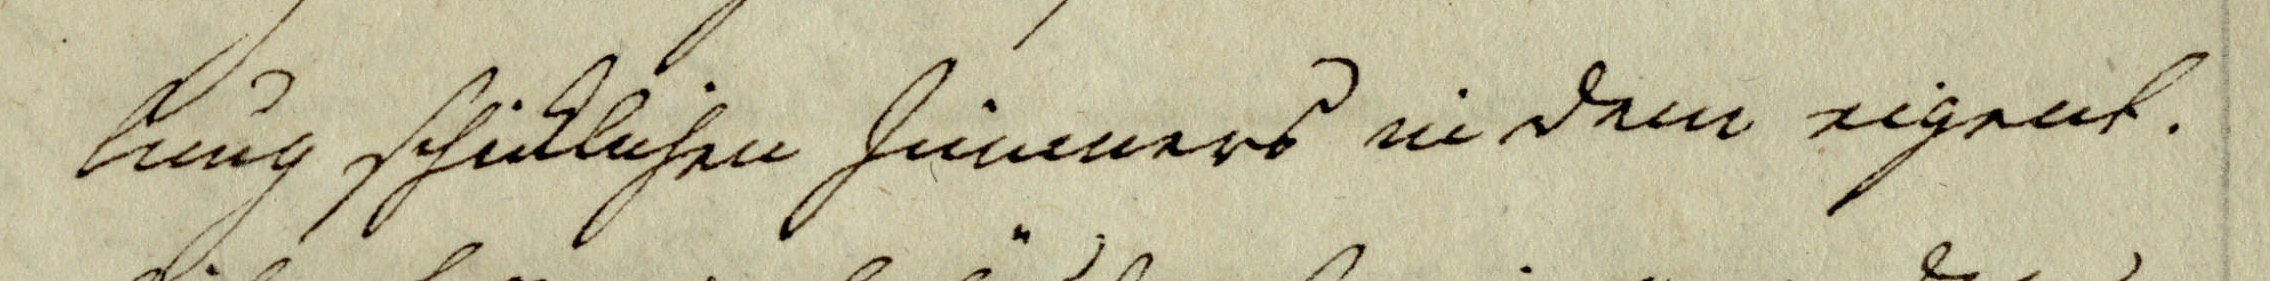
lung schicklichen Zimmers in dem eigent¬
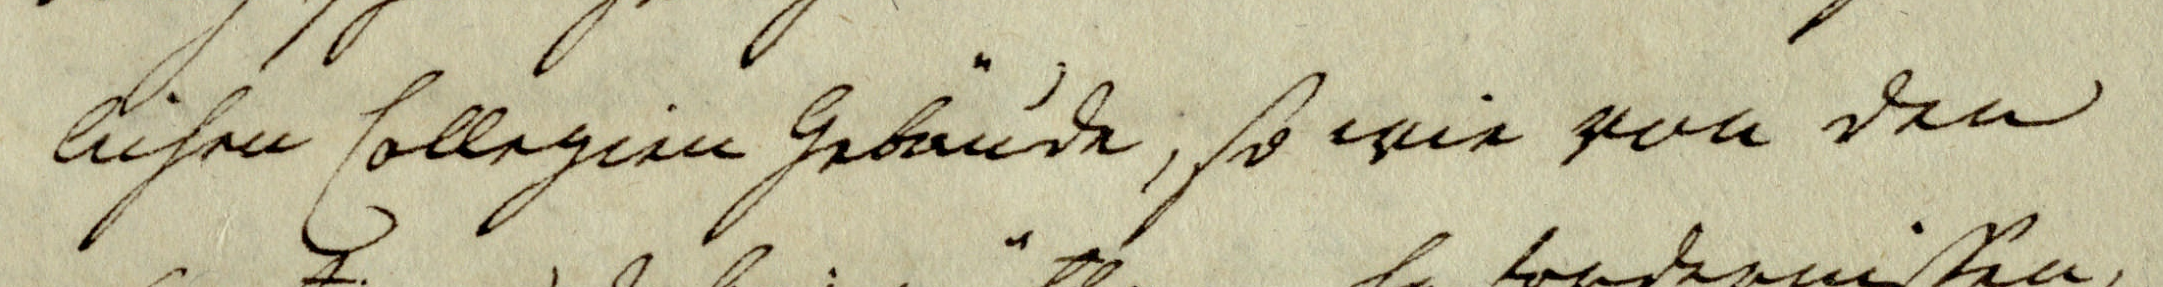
lichen Collegien Gebäude, so wie von den
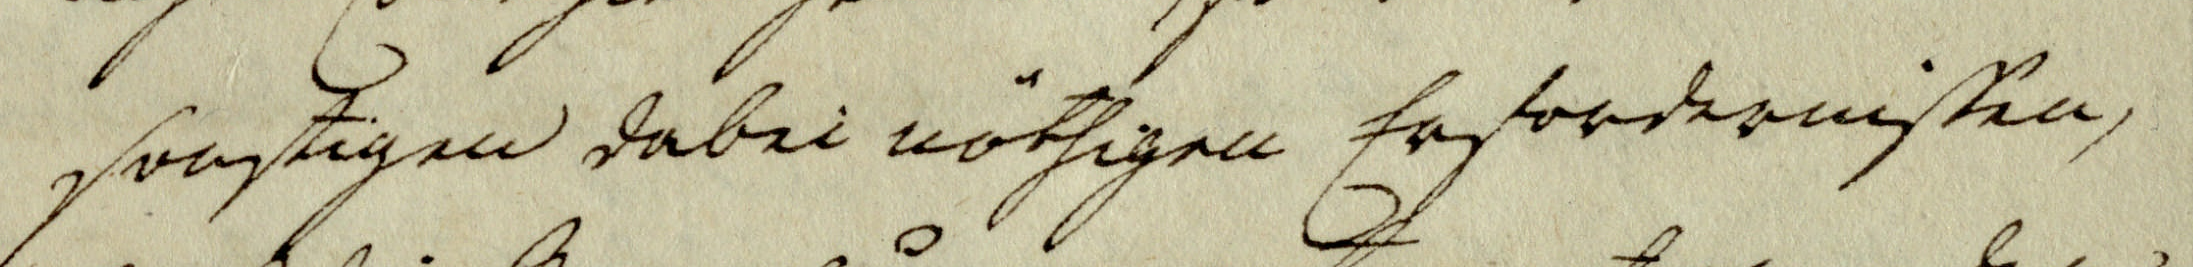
sonstigen dabei nöthigen Erfordernissen,
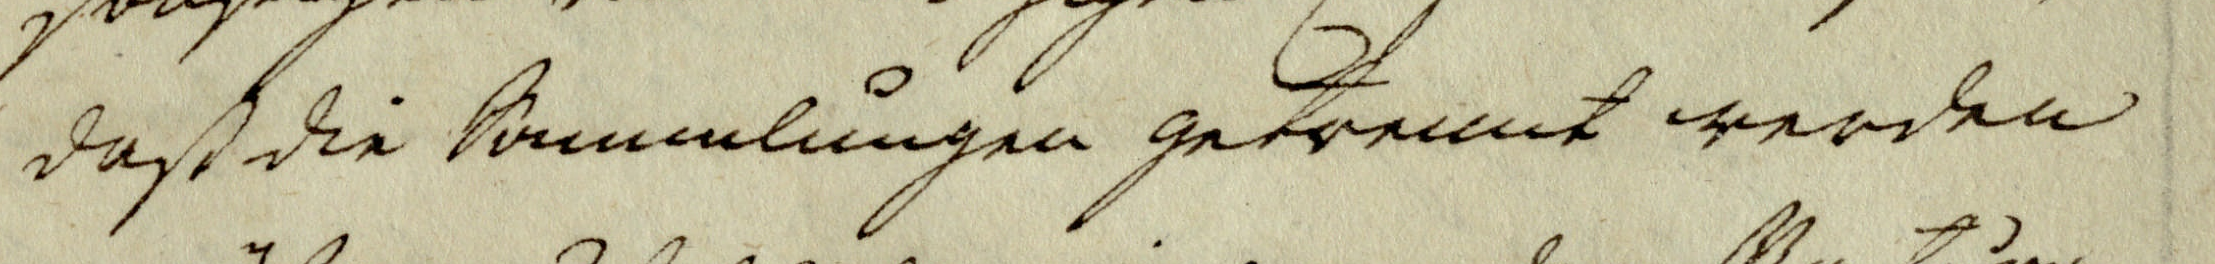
daß die Sammlungen getrennt werden
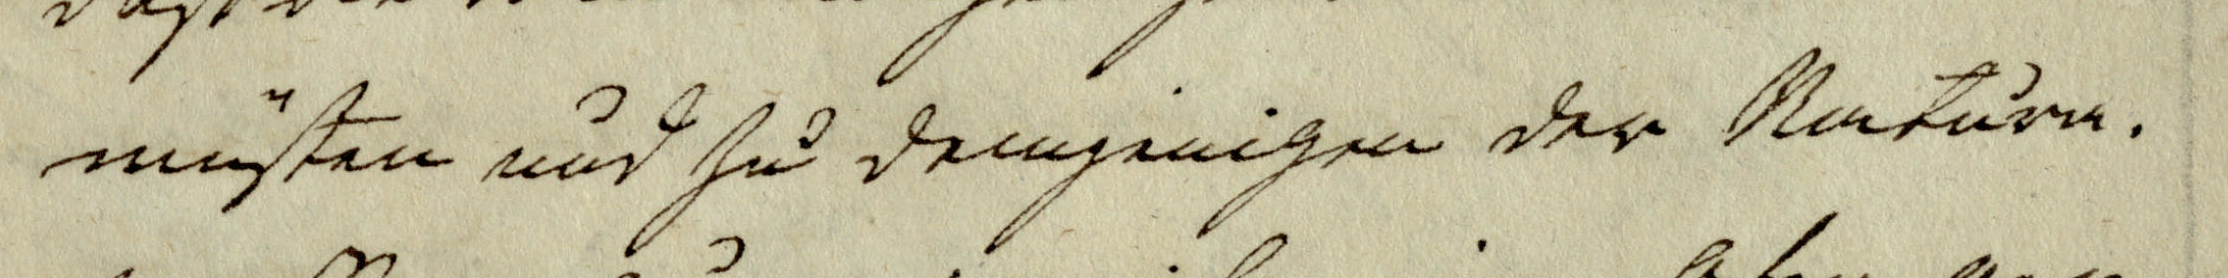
müßten und zu demjenigen der Natura¬
